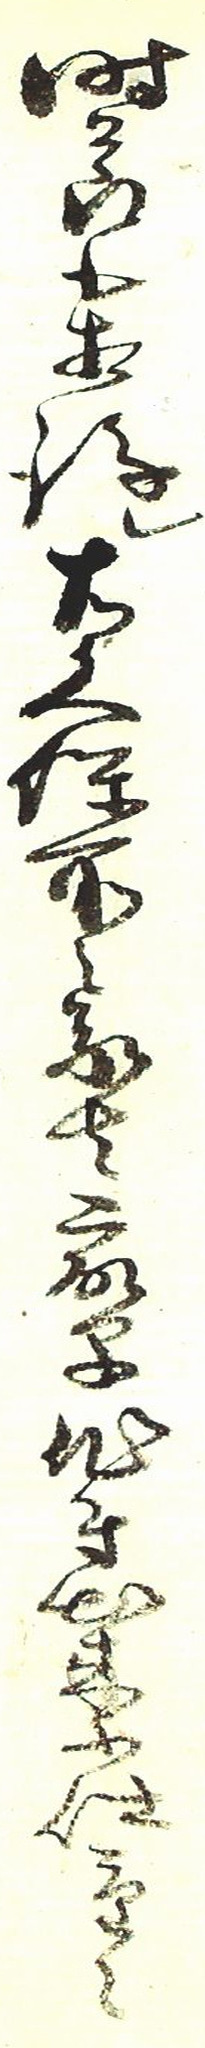時節も相後れ右久保所之義は最早作付出来不仕重々
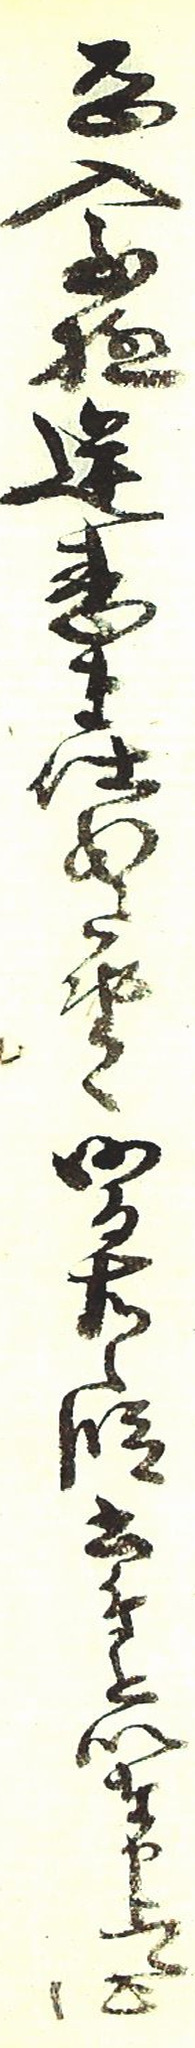恐入至極迷惑奉仕義に御座候仍て右之段書付を以奉申上候以上
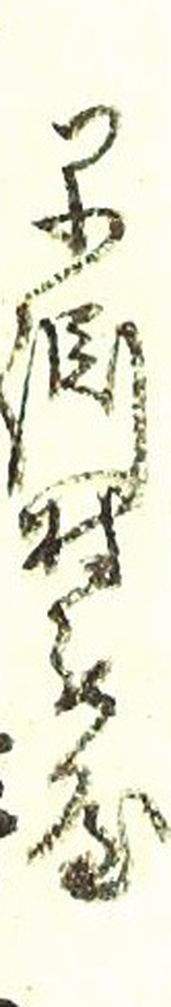早淵村庄屋
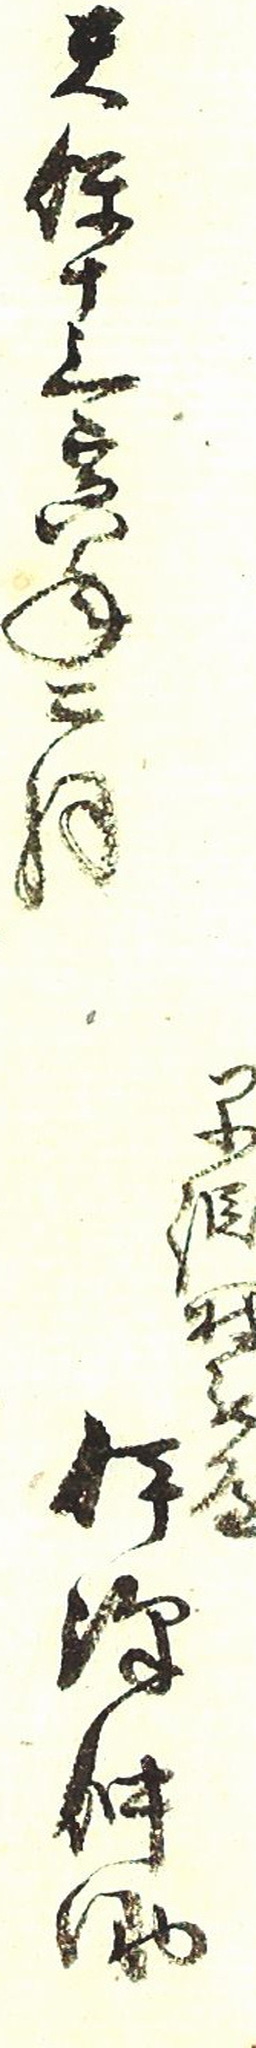天保十三寅年二月伊沢仲助
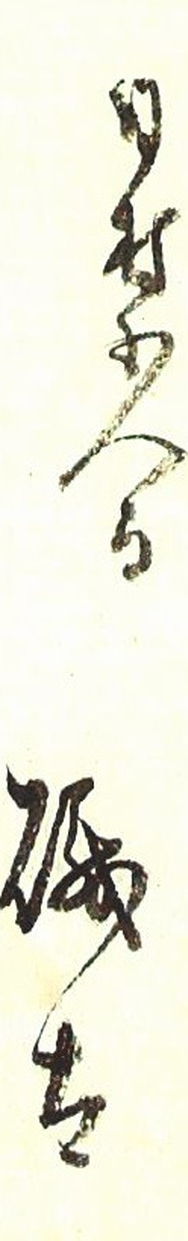同村五人与磯太
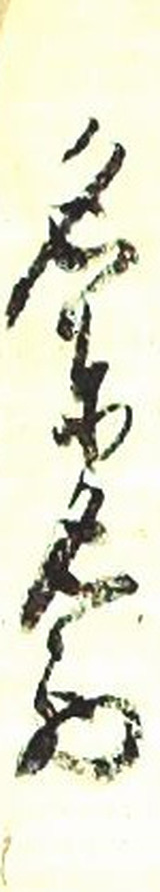名東名西
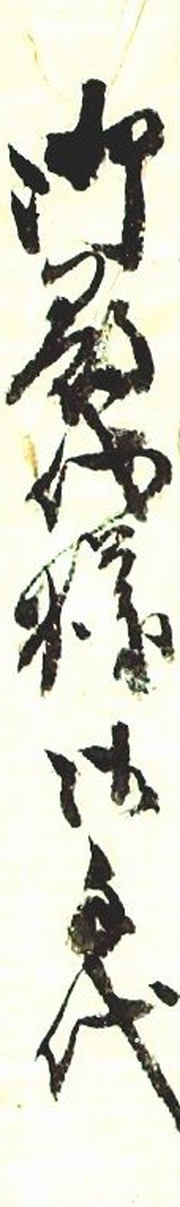御郡代様御手代
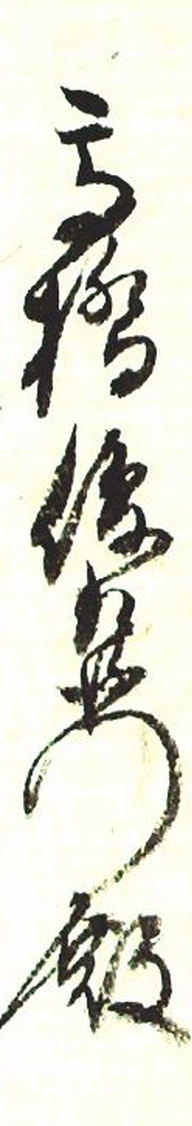高橋俊左衛門殿
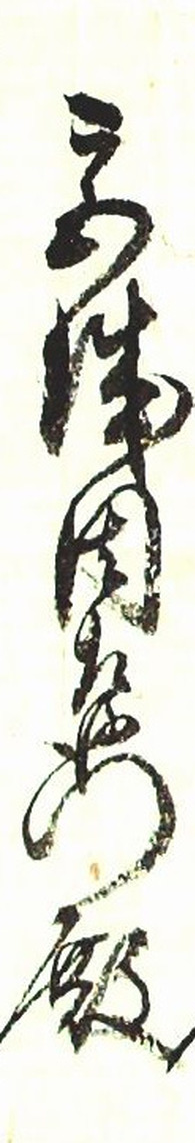宮城周左衛門殿
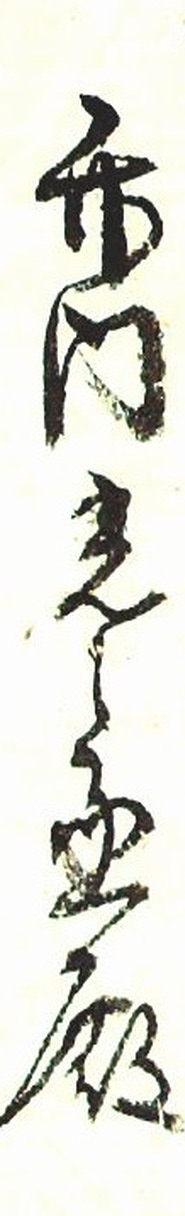竹内光之丞殿
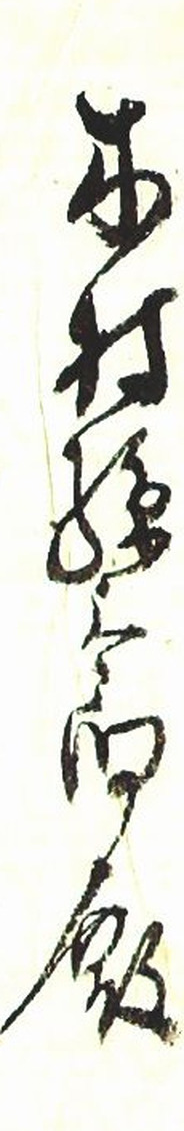木村孫三郎殿

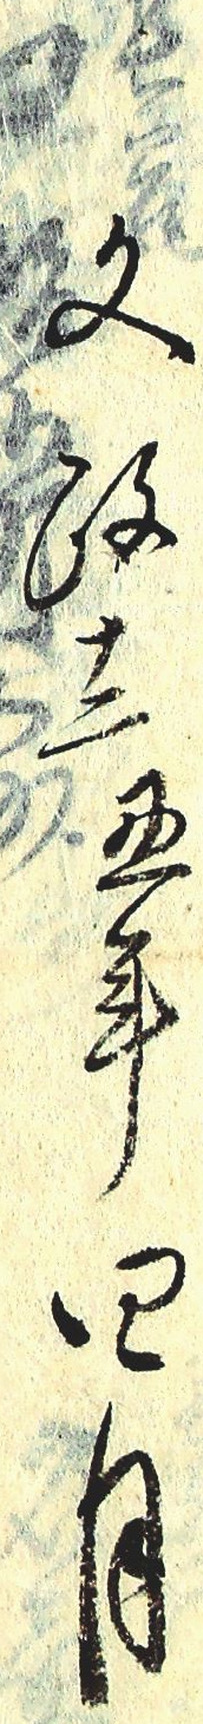文政十二丑年四月
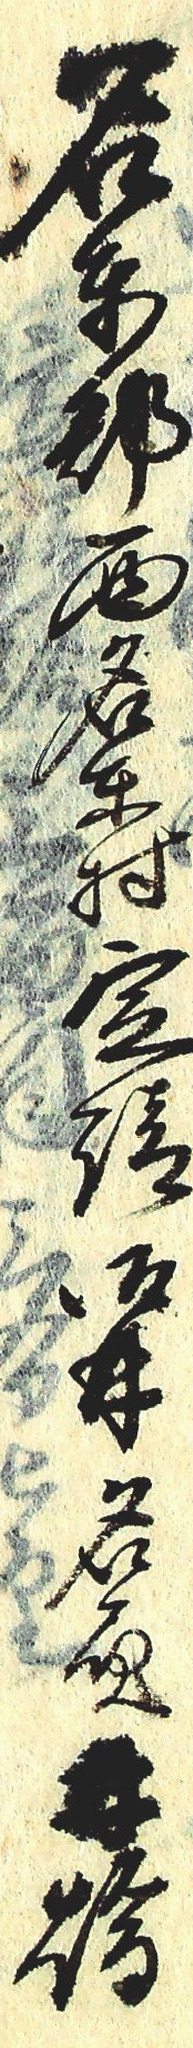名東郡西名東村定請御林名負林焔
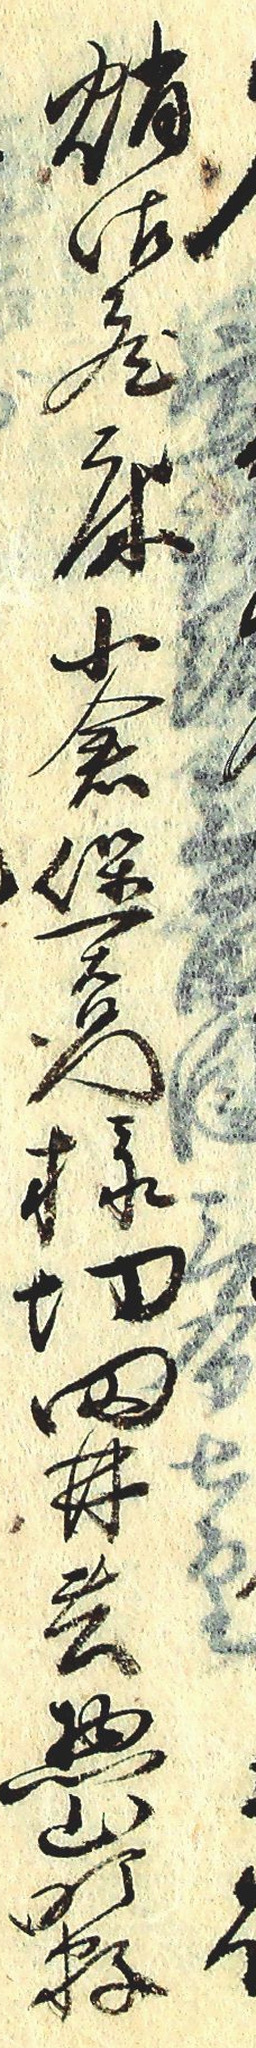硝御蔵床小倉保一右衛門様切田林共惣山町数
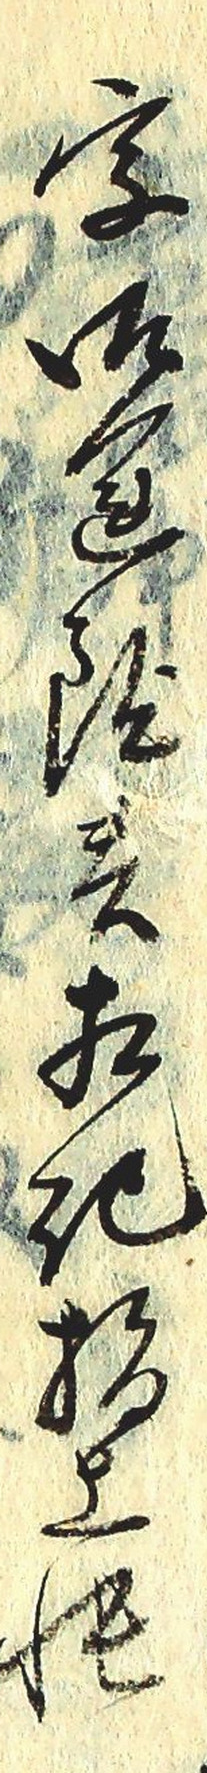字御運銀共相記指上帳
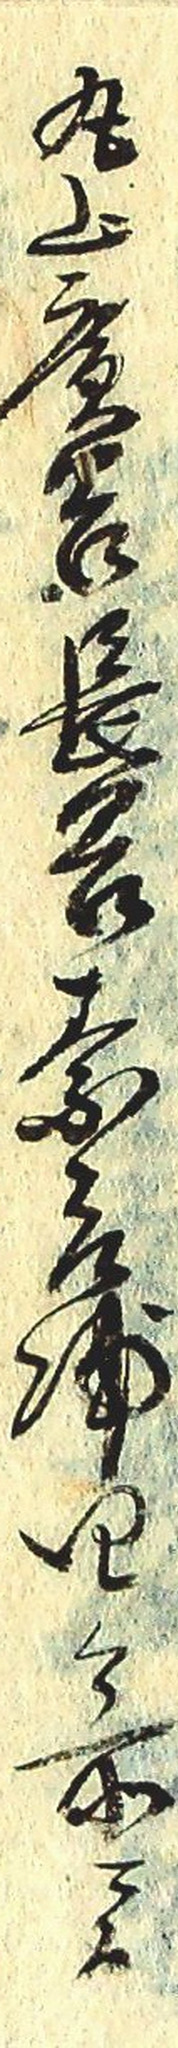丸山広谷長谷素吉浦四ヶ所にて
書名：諸御願書控(弐番）
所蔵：鳴門教育大学 Naruto University of Education
